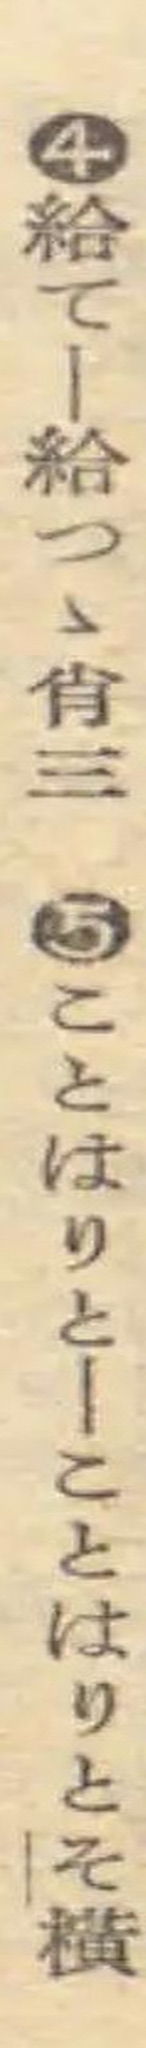❹給て―給つゝ肖三❺ことはりと―ことはりとそ横
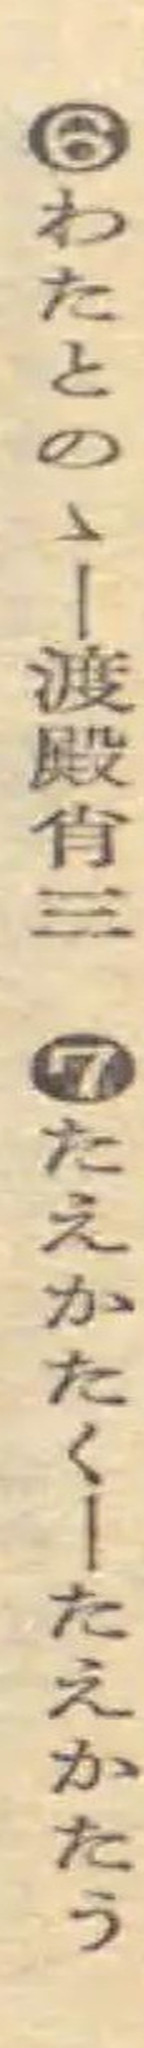❻わたとのゝ―渡殿肖三❼たえかたく―たえかたう
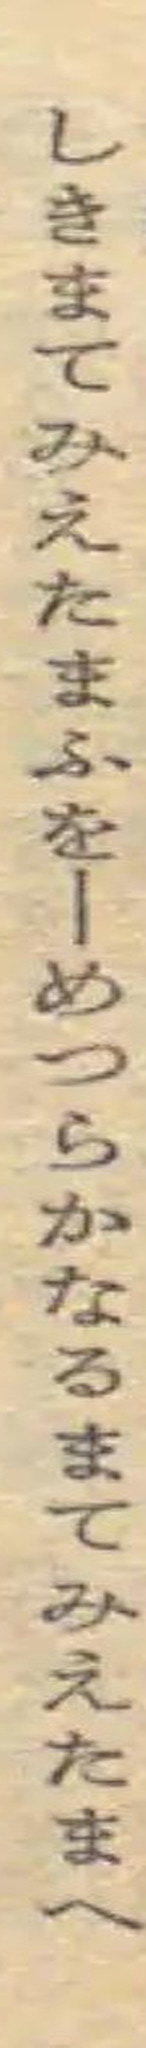しきまてみえたまふを―めつらかなるまてみえたまへ
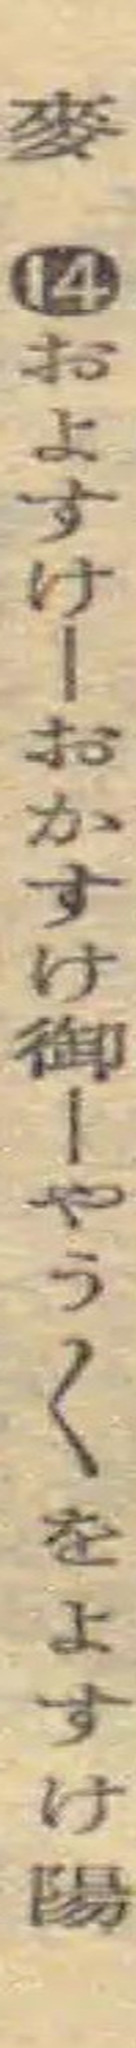麦⓮およすけ―おかすけ御―やう〳〵をよすけ陽
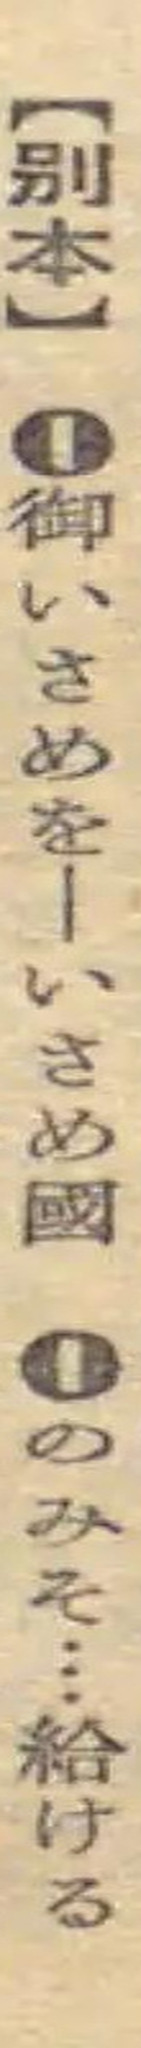[別本]➊御いさめを―いさめ国➊のみそ…給ける
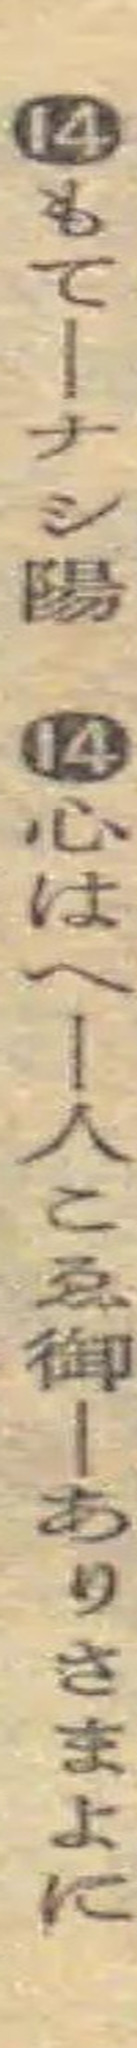⓮もて―ナシ陽⓮心はへ―人こゑ御―ありさまよに
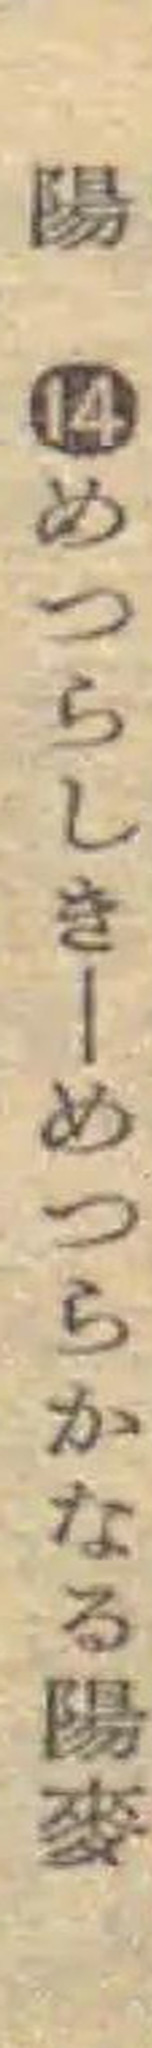陽⓮えつらしき―めつらかなる陽麦
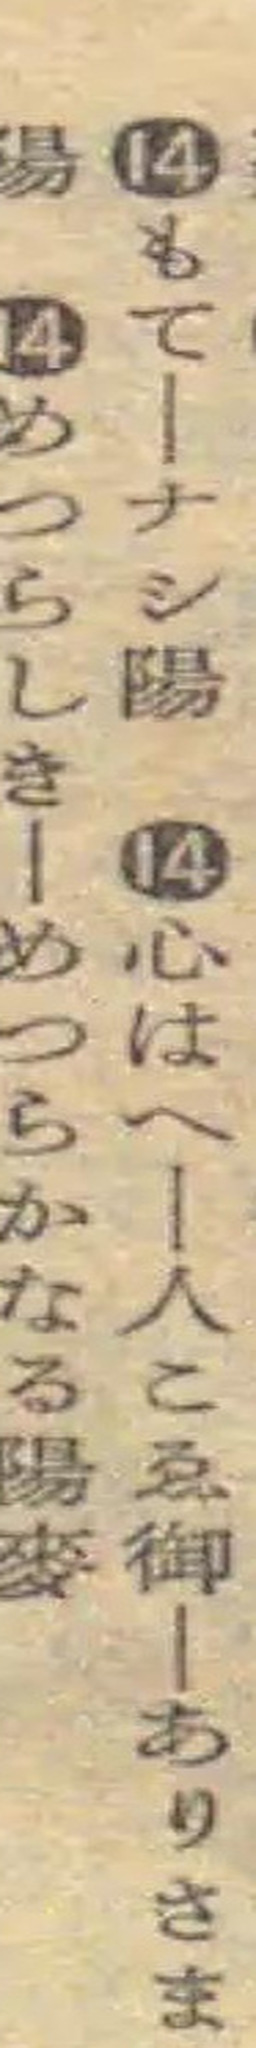陽⓮えつらしき―めつらかなる陽麦
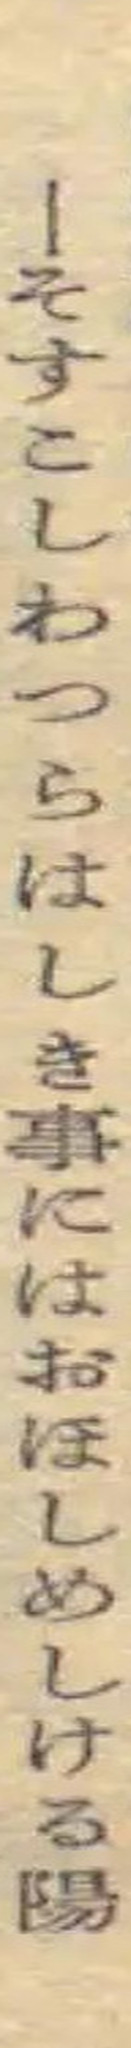―そすこしわつらはしき事にはおほしましける様
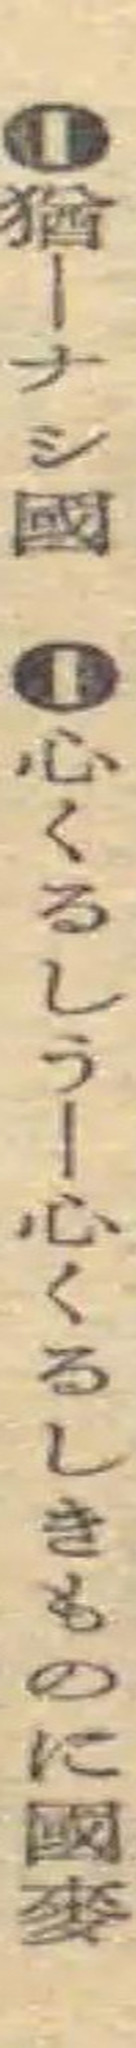➊猶―ナシ国➊心くるしう―心くるしきものに国麦
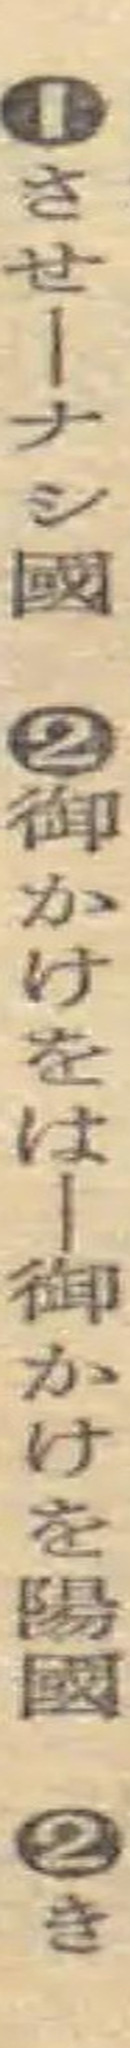➊させ―ナシ国➋御かけをは―御かけを陽国➋き
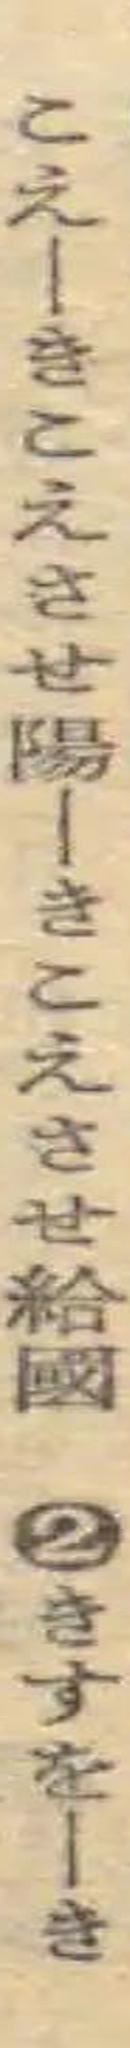こえ―きこえさせ陽―きこえさせ給国➋きすを―き
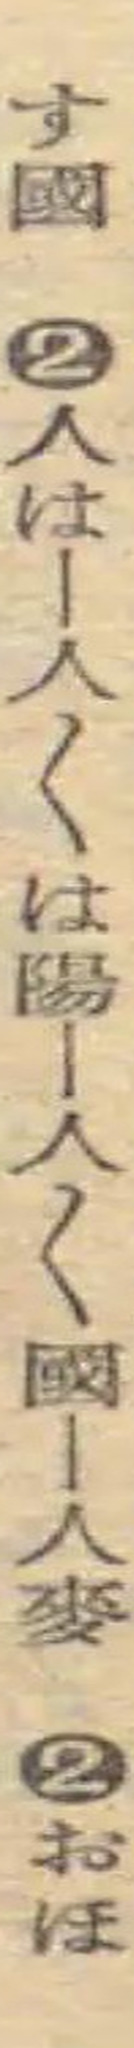す国➋人は―人〳〵は陽―人〳〵国―人麦➋おほ
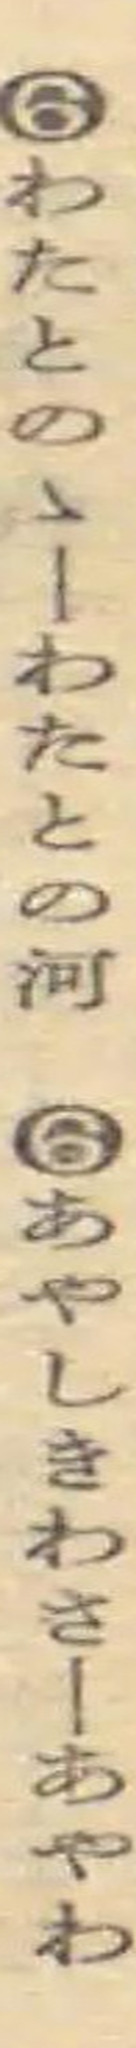❻わたとのゝ―わたとの河❻あやしきわさ―あやわ
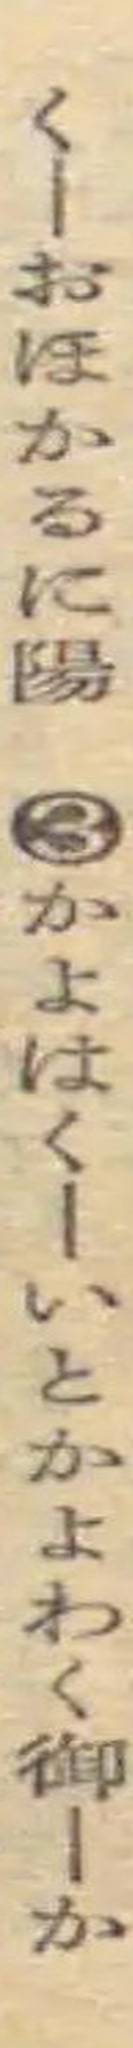く―おほかるに陽❸かよはく―いとかよわく御―か
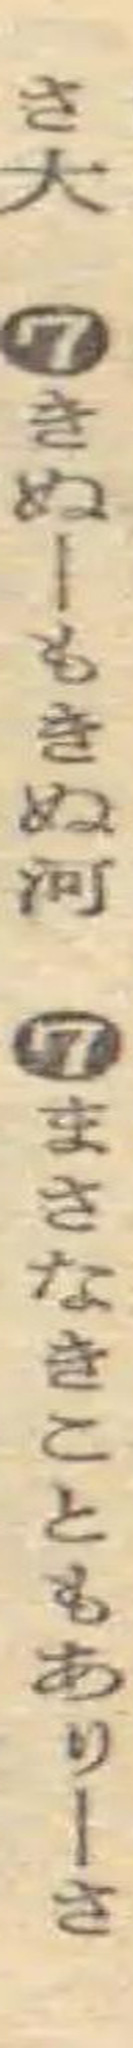さ大❼きぬ―もきぬ河❼まさなきこともあり―さ
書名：校異源氏物語.
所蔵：国立国会図書館 National Diet Library, JAPAN
